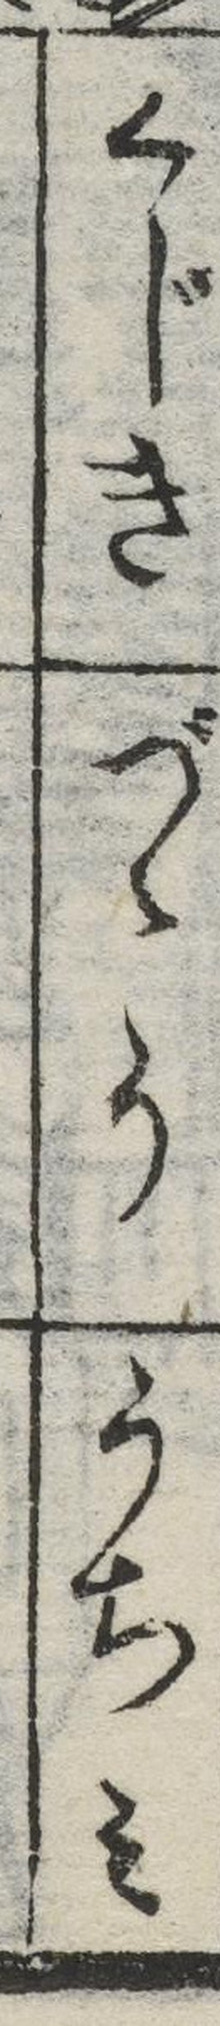くじきづゝううちみ
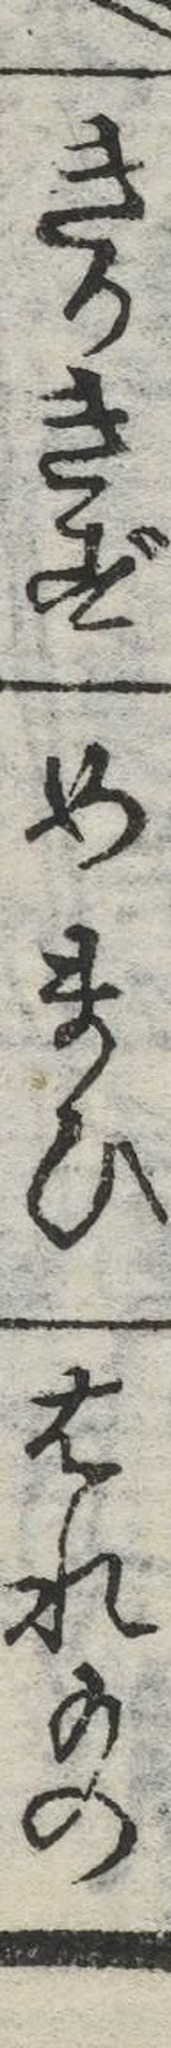きりきずめまひはれもの
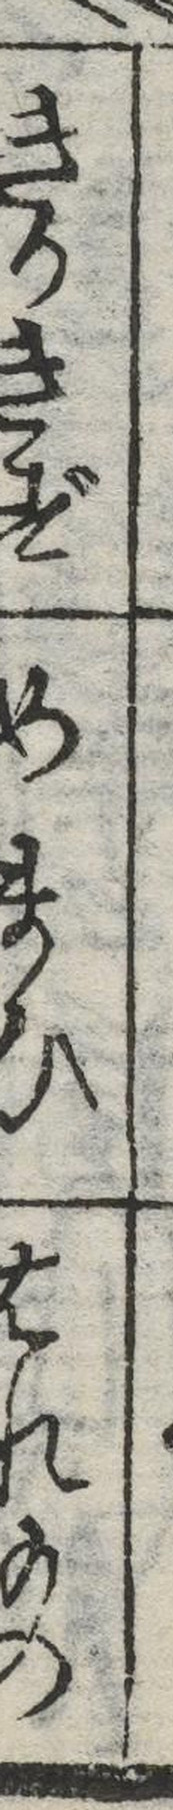きりきずめまひはれもの
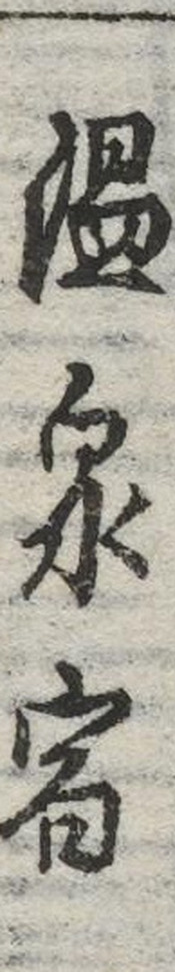温泉宿
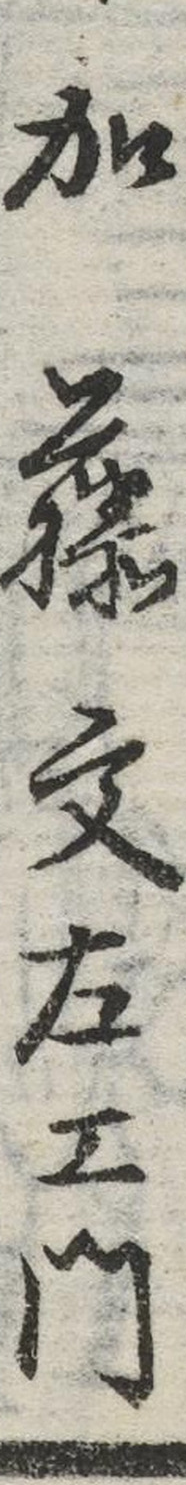加藤文左エ門
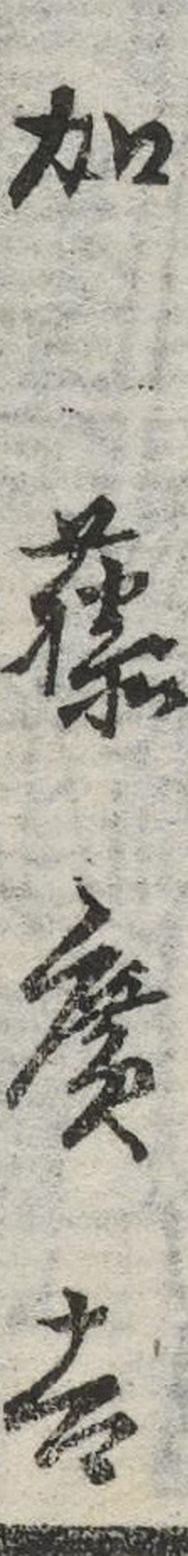加藤広吉
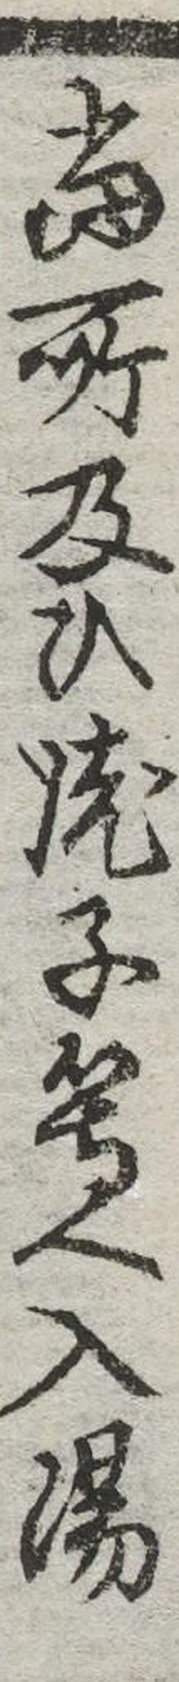当所及ひ姥子等へ入湯
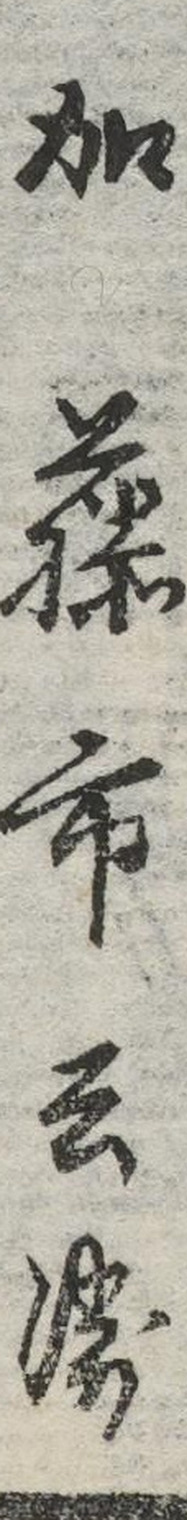加藤市兵衛
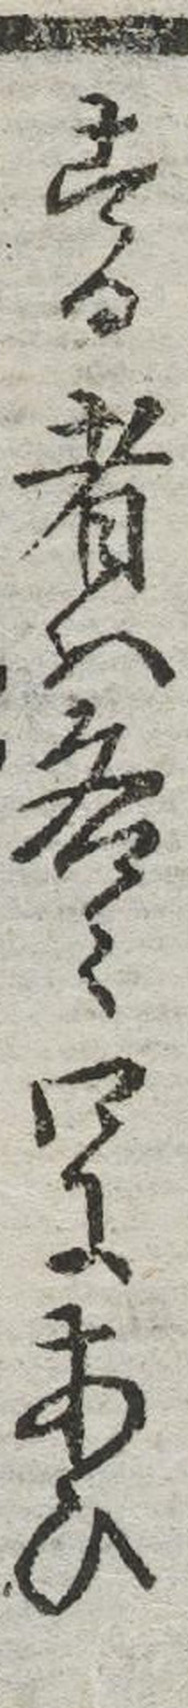する者は各々口にあひ
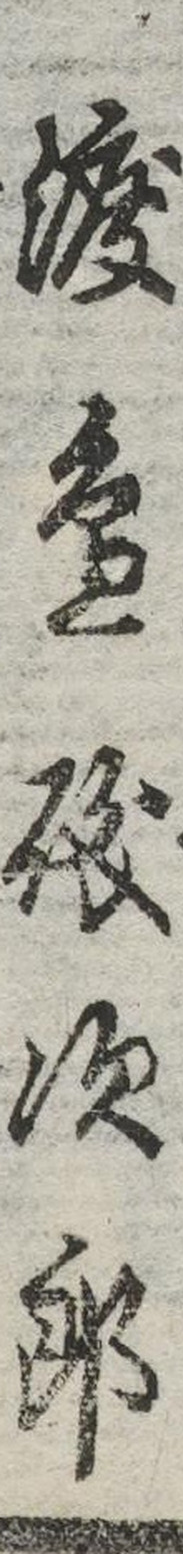渡辺磯次郎
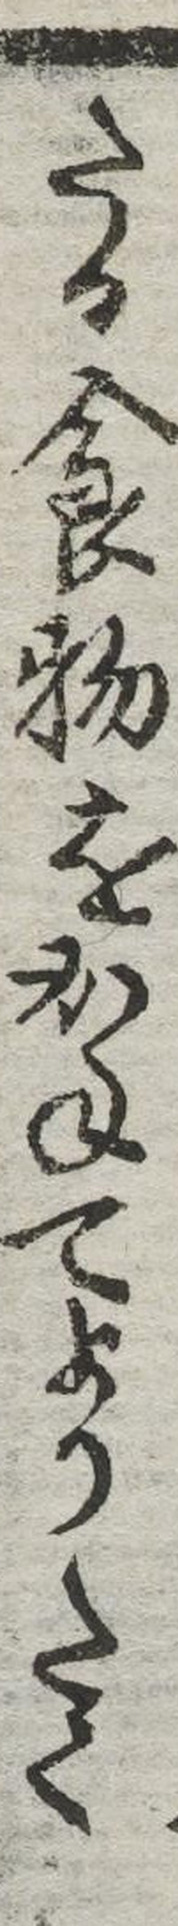たる食物をかねてよりたく
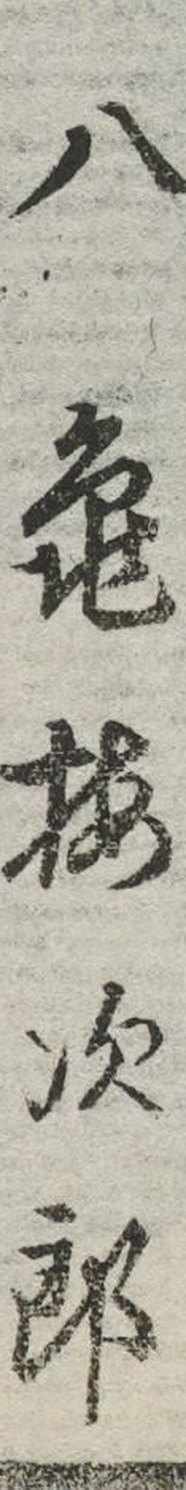八亀梅次郎
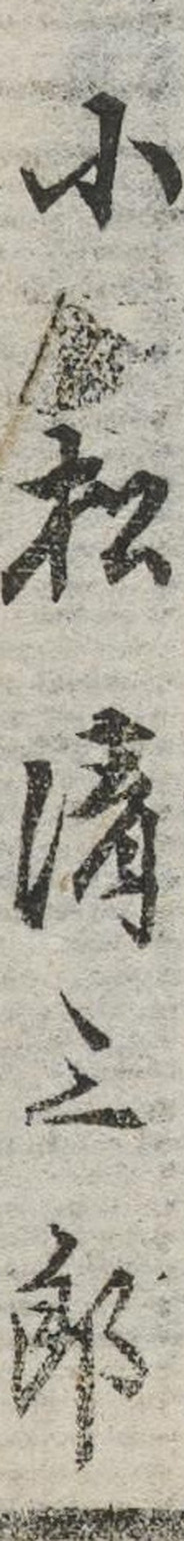小松清三郎
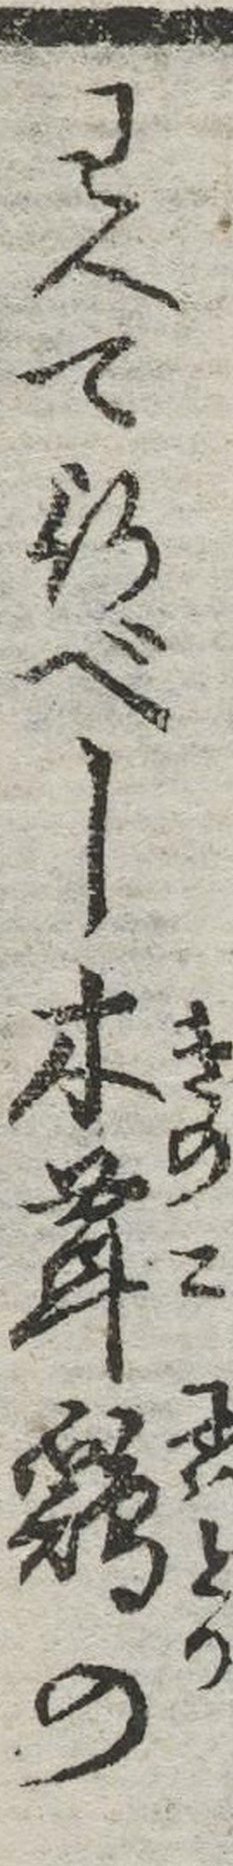はへて行べし木茸鶏の
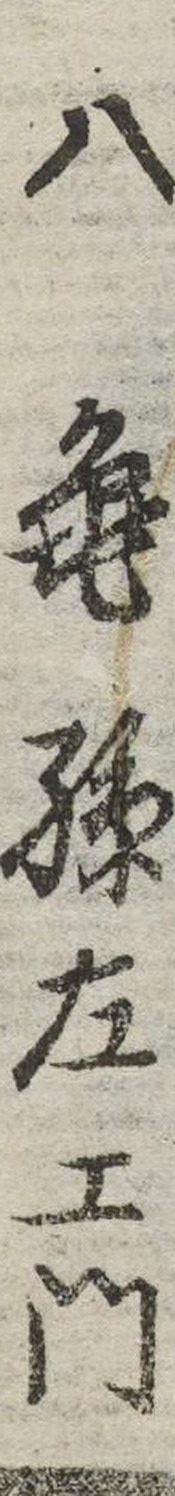八亀孫左エ門
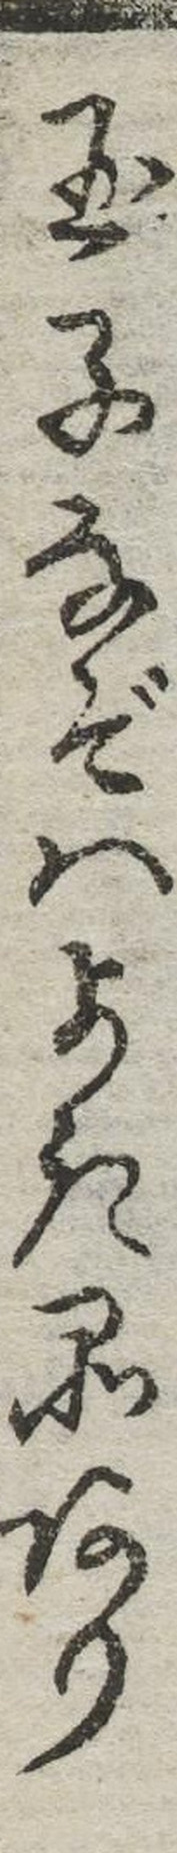玉子なぞはよき品あり
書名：諸國温泉遊覽記　全
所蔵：東京大学地震研究所図書室 Earthquake Research Institute Library, The University of Tokyo, JAPAN
